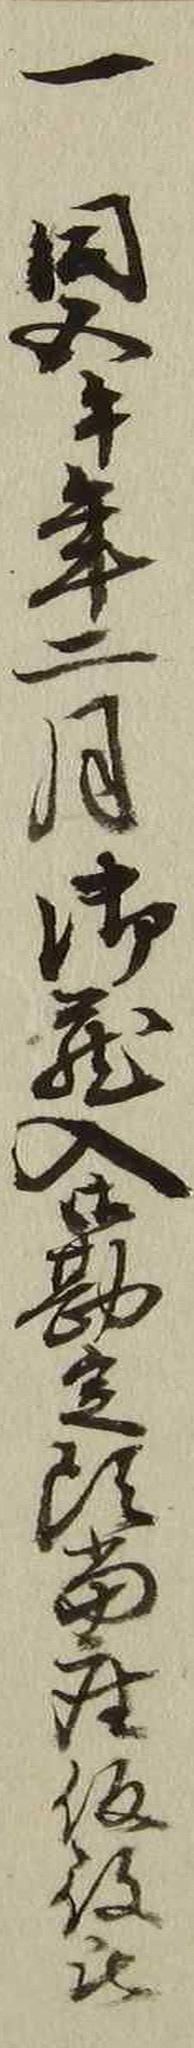一同五午年二月御蔵入御勘定頭当座仮役被
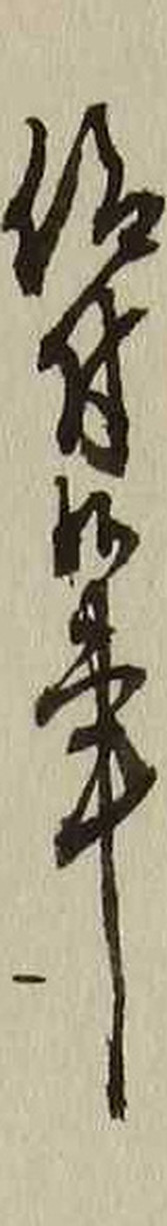仰付候事
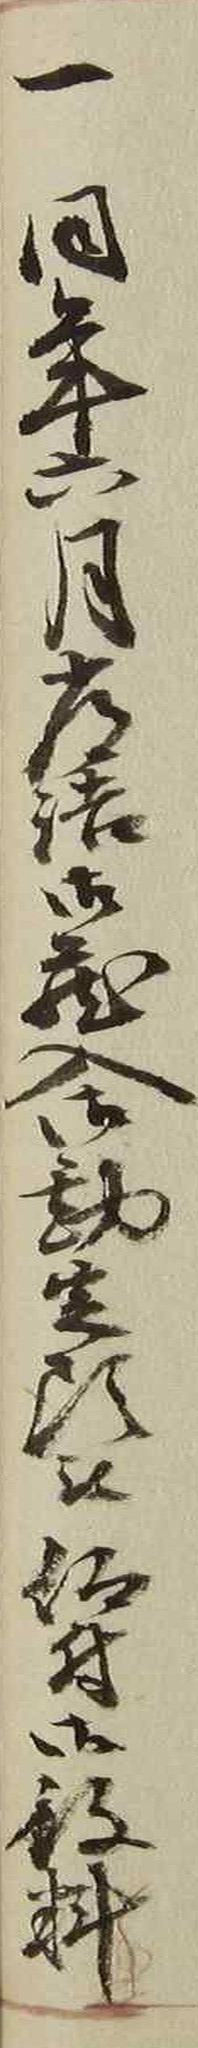一同年六月常詰御蔵入御勘定頭被仰付御役料
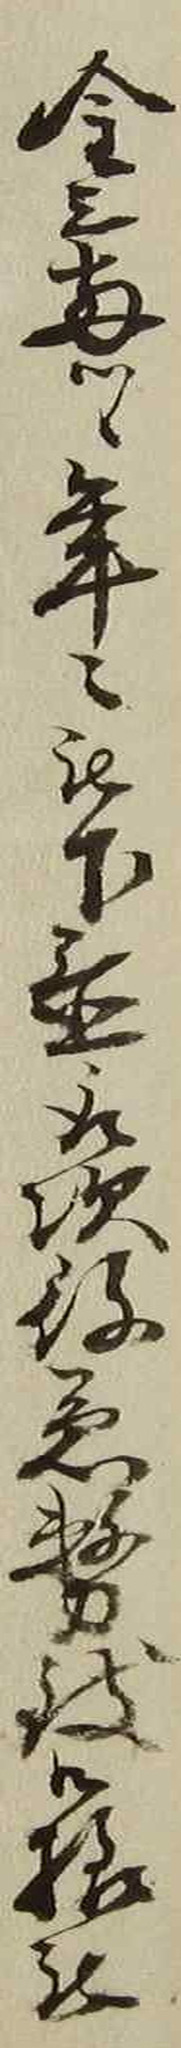金三両ツヽ年々被下置取次役兼務致候様被
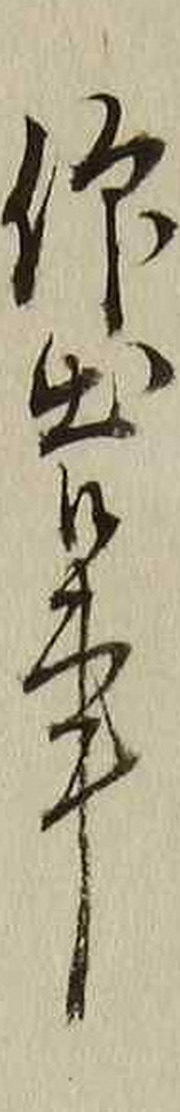仰出候事
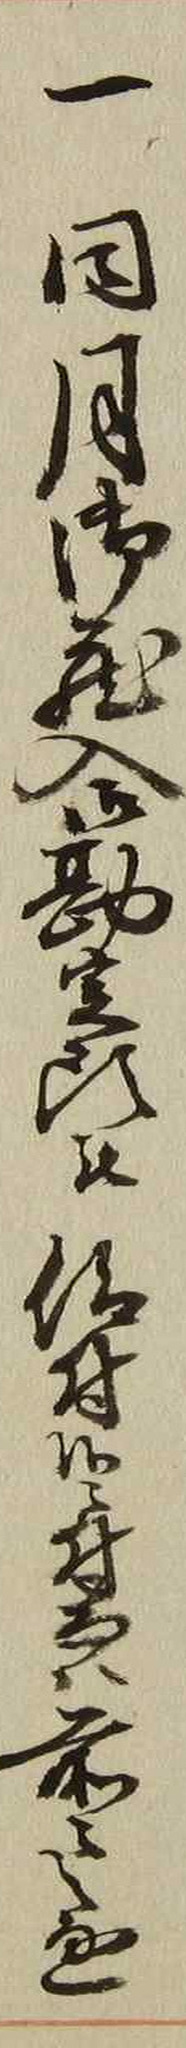一同月御蔵入御勘定頭被仰付候に付而は前々之通
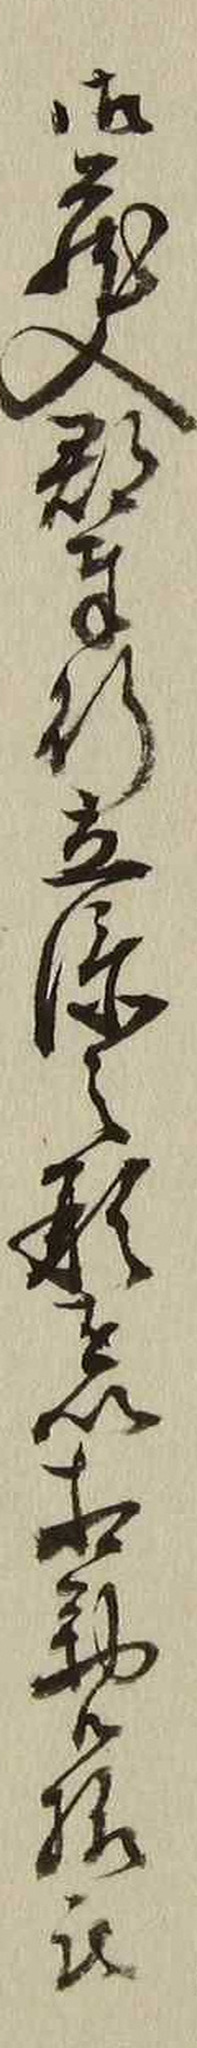御蔵入郡奉行立添之形を以相勤候様被
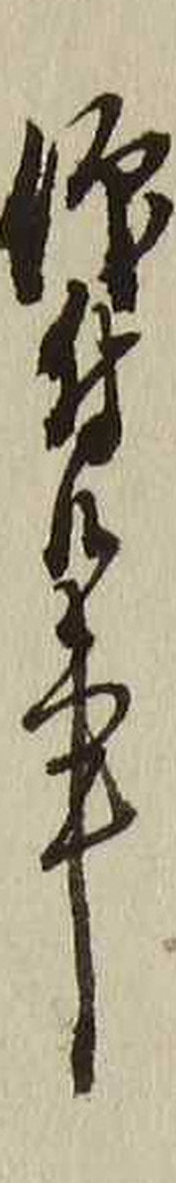仰付候事
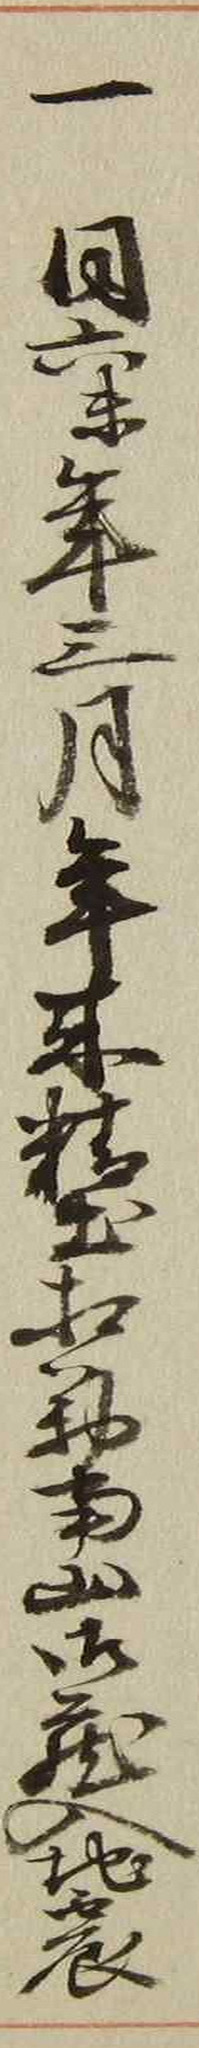一同六未年三月年来精出相勤南山御蔵入地震
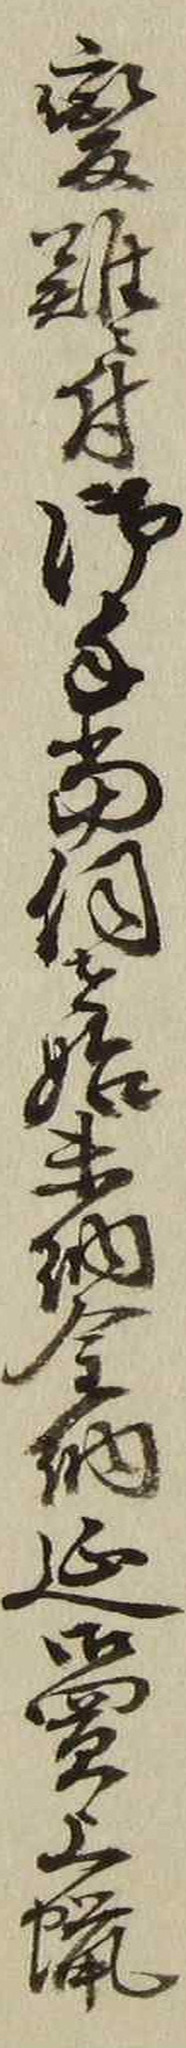変難に付御手当伺を始未納金納延御買上蝋
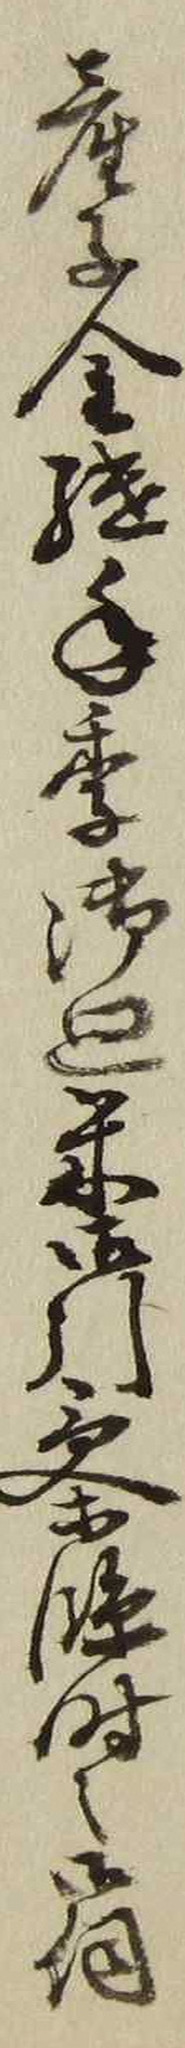産子金継年季御廻米御引受等臨時之御伺
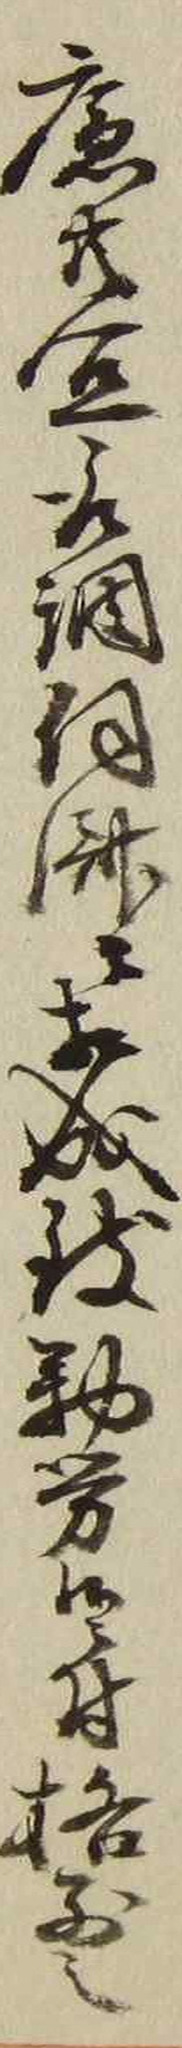廉共宜取調伺済に相成致勤労候に付格別之
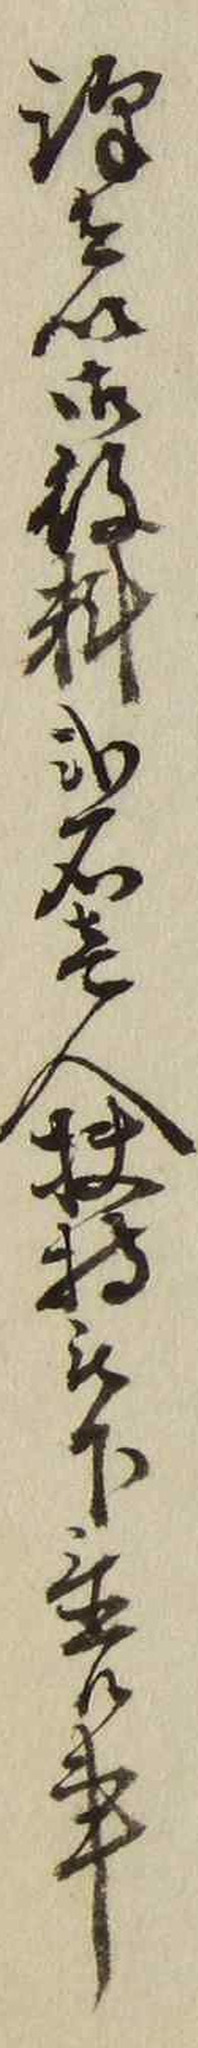訳を以御役料弐石壱人扶持被下置候事

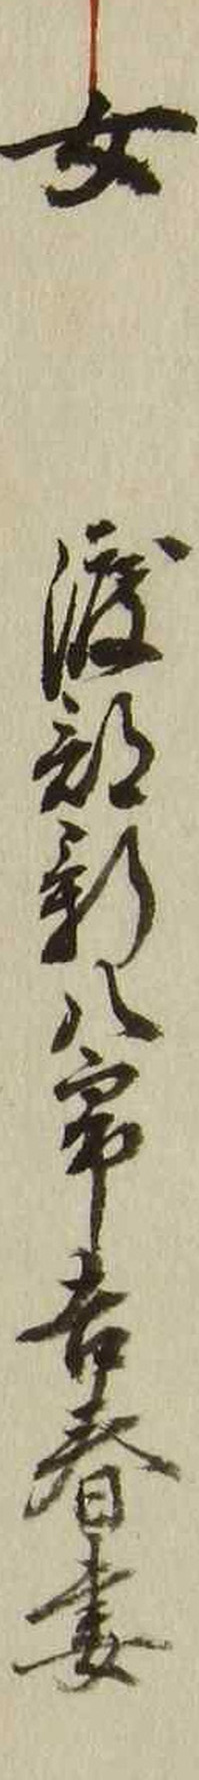女渡部新八郎吉春妻
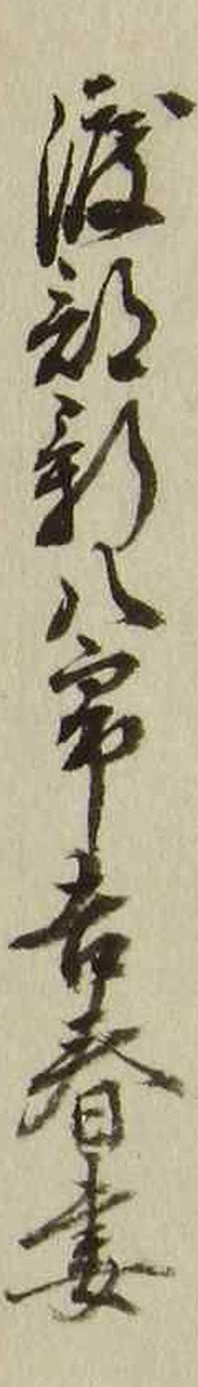女渡部新八郎吉春妻
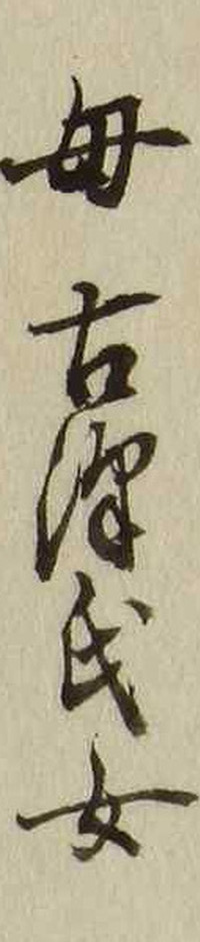母古沢氏女
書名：諸士系譜　巻之38　は之部6
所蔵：会津若松市立会津図書館
